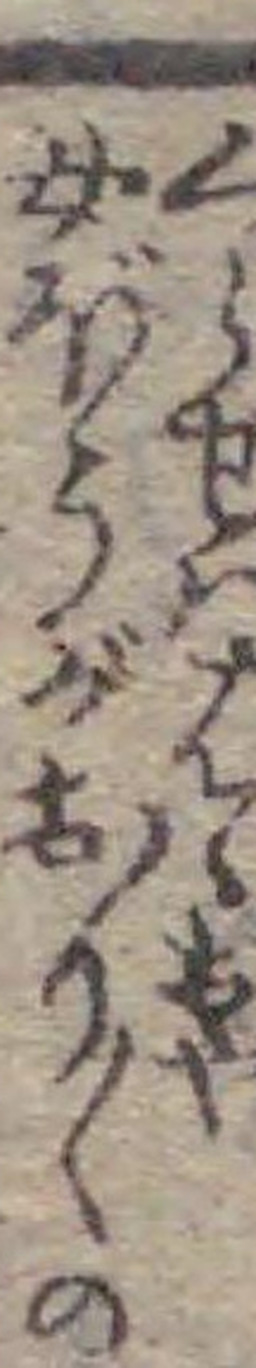女ぼうがおり〳〵の
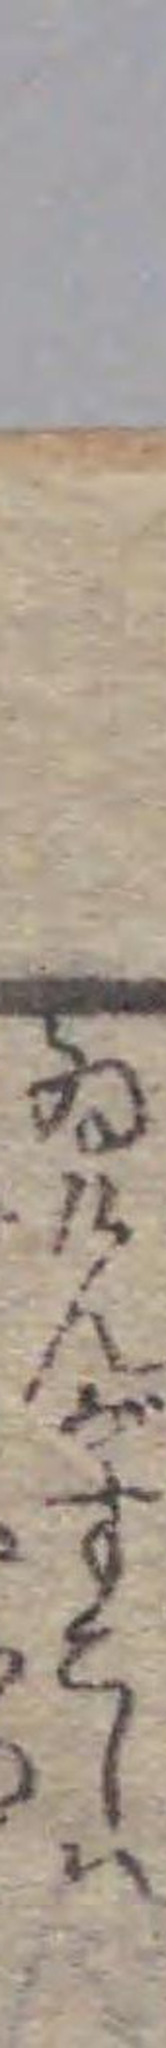ゐけんがすこしは
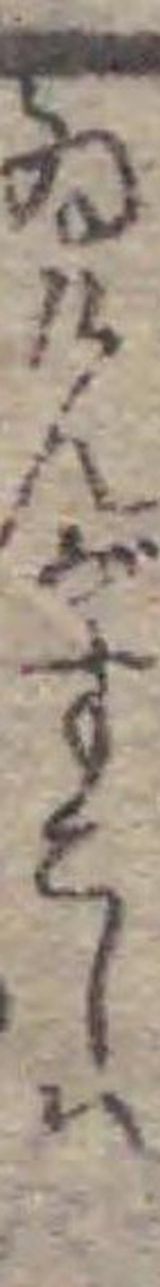ゐけんがすこしは
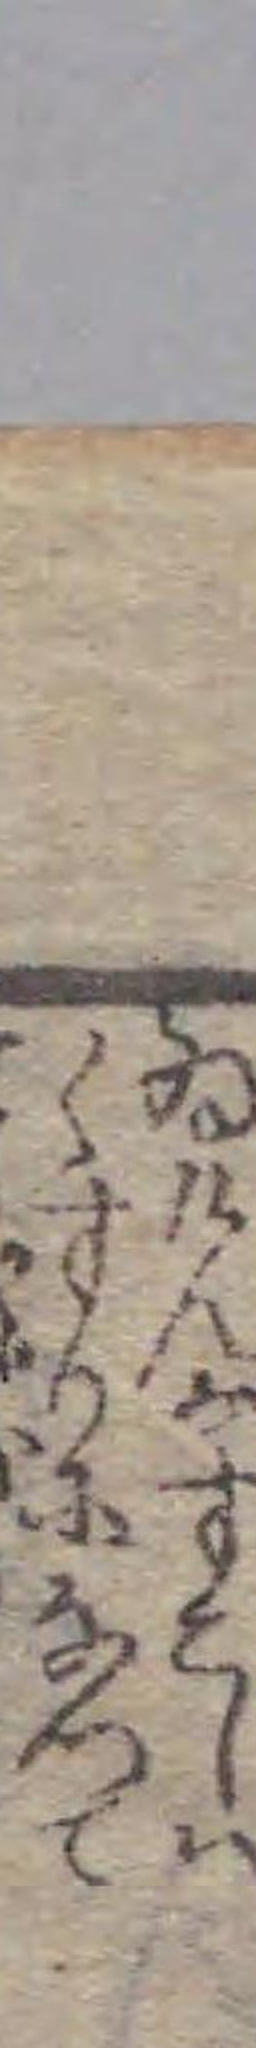くすりになつて
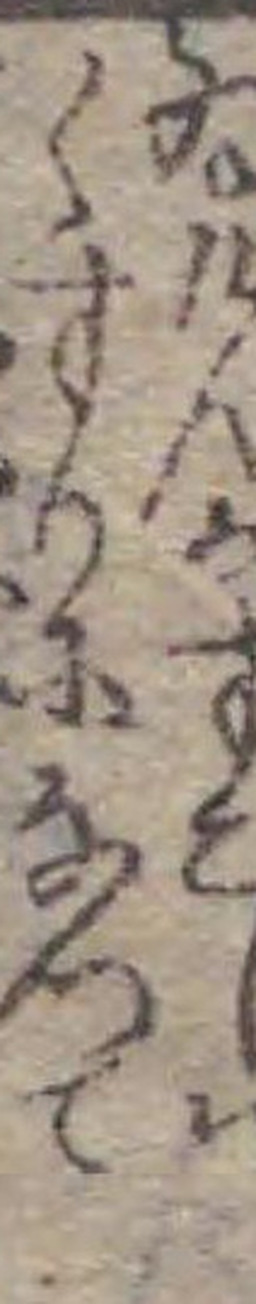くすりになつて
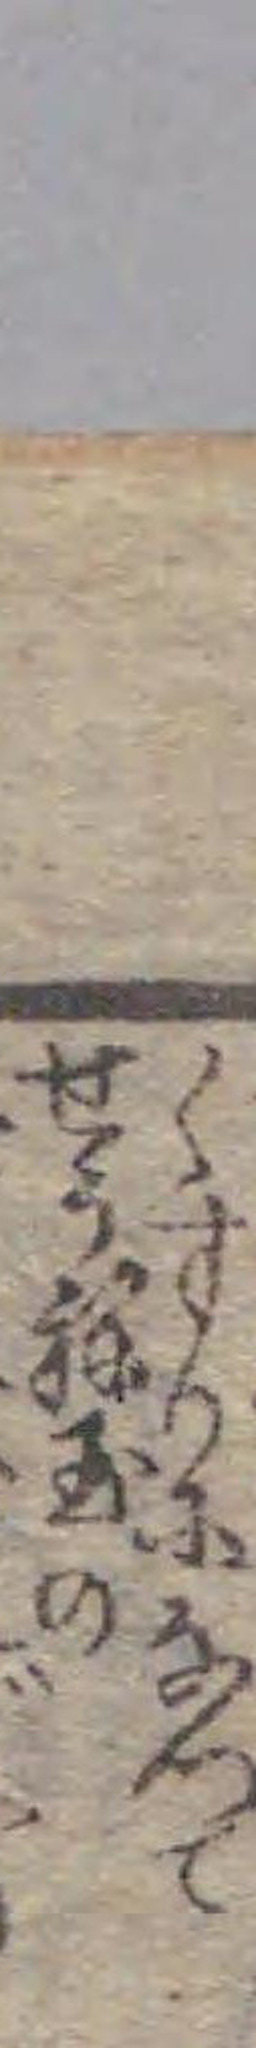せうね玉の
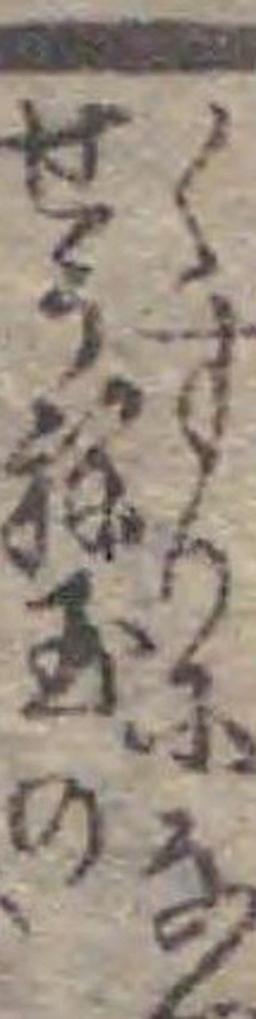せうね玉の
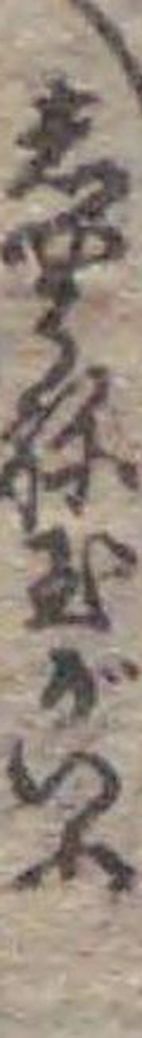しやうね玉がいふ
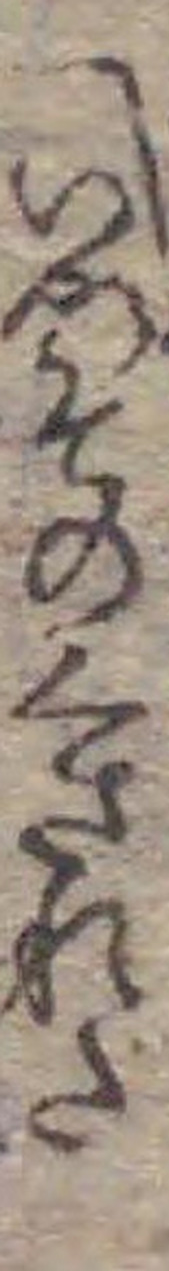〽いつそのくされだ
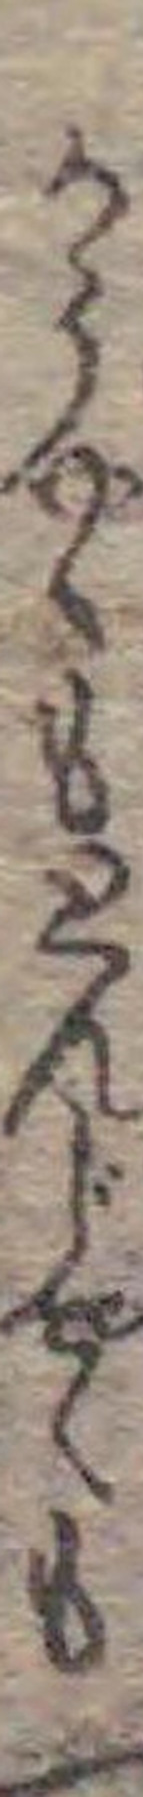かうやくもとんじやくも
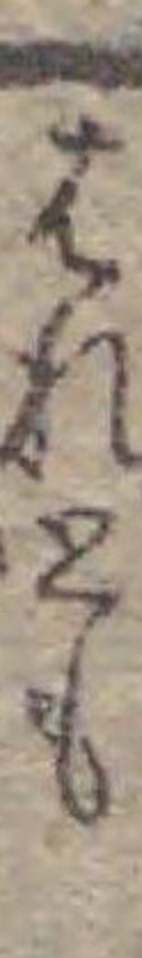はれども
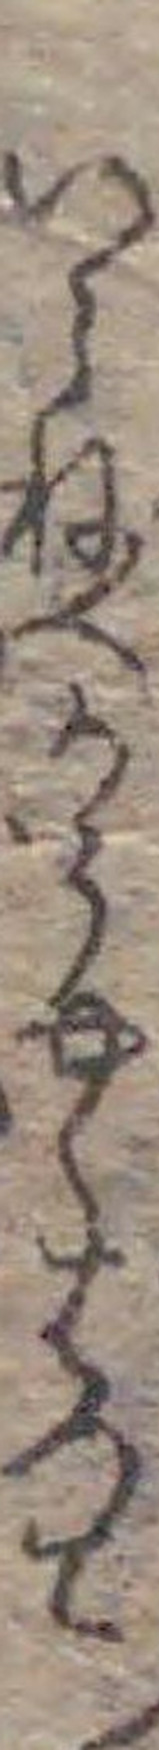いらねへかうやくはつて
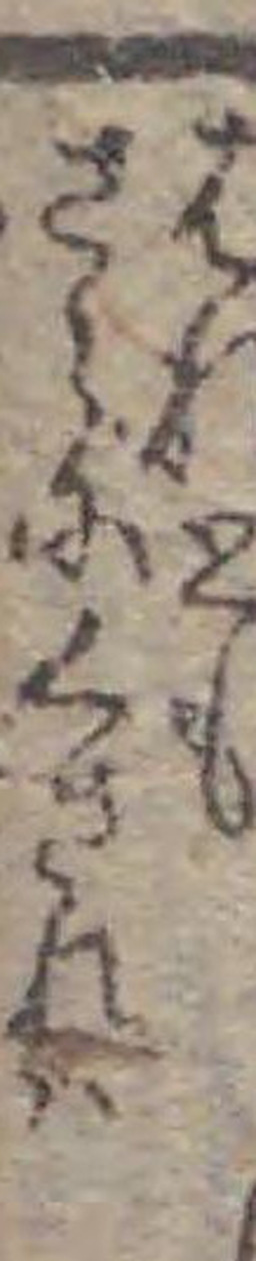さらにくされは
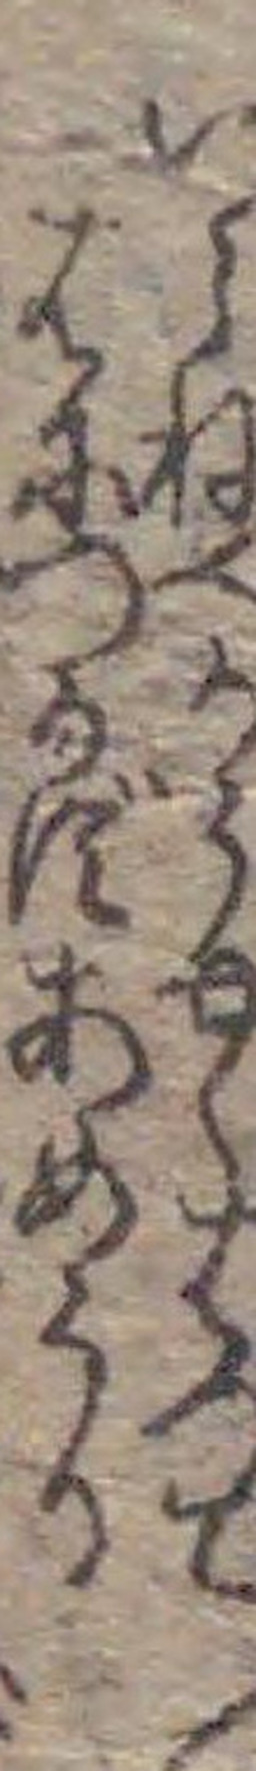はにつかずあめうり

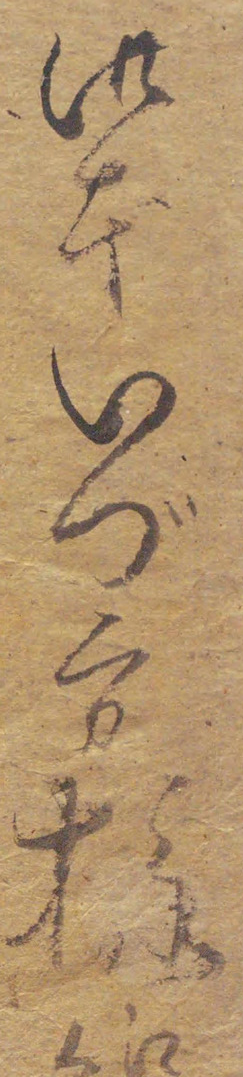此本いづ方様え
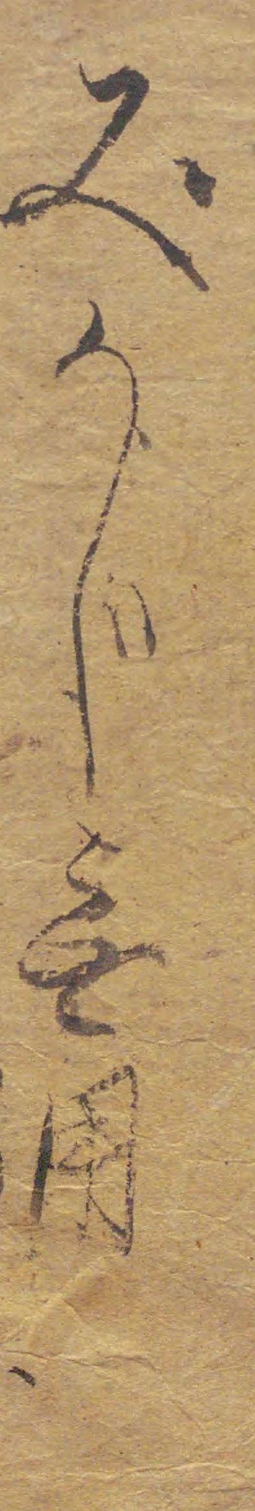又がし無用
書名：四遍搨心学草帋 : 3巻
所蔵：国立国会図書館 National Diet Library, JAPAN
